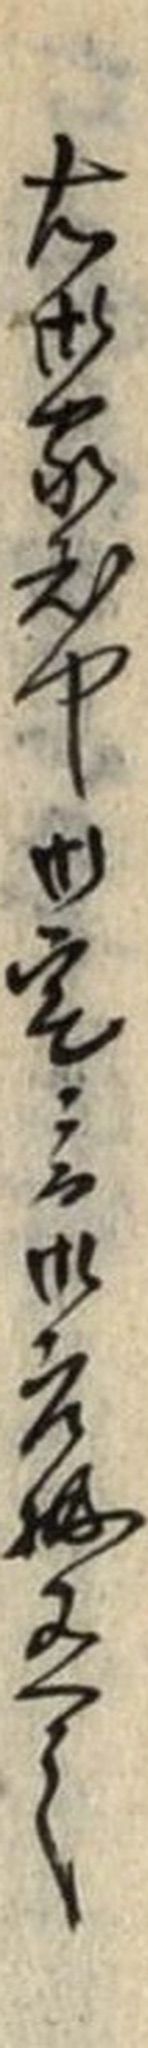右御家老中御宅に而御取扱有之
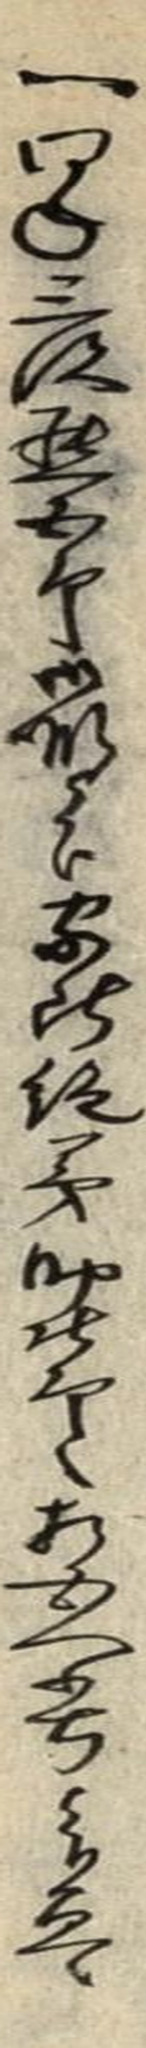一同年三沢熊五郎御暇被下家断絶弟助次郎へ拾五人ふち被下置候
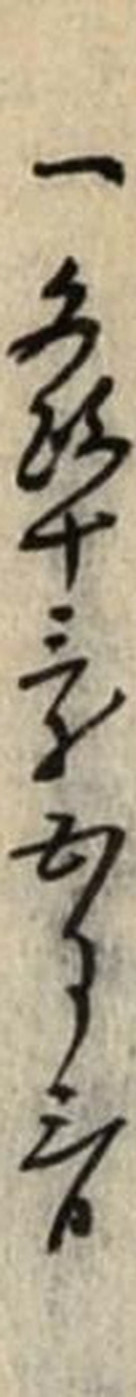一文政十三寅五月三日
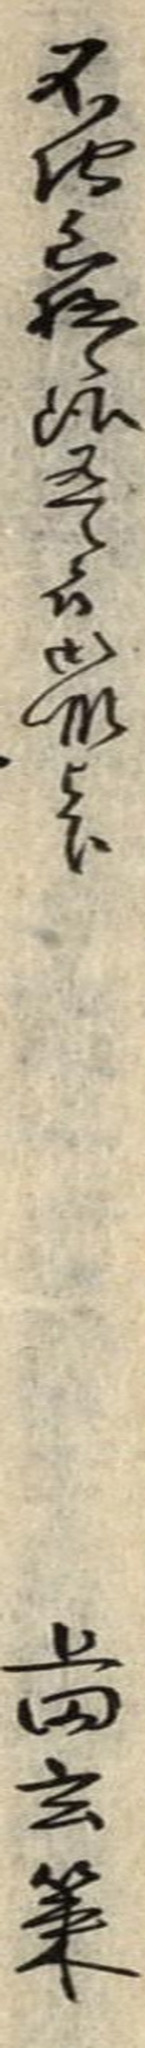不埒至極之趣有之候に付御暇被下上田玄策
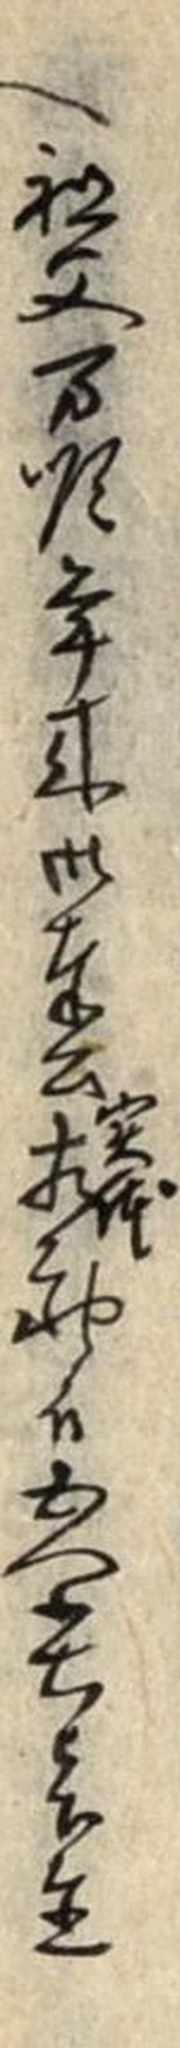祖父万順年来御奉公実体相勤候付五人ふち被下置
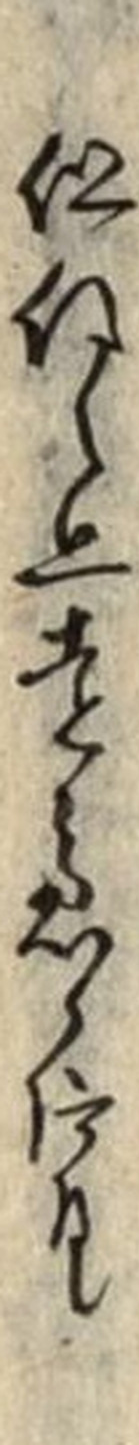但伺之上遠慮被仰付候

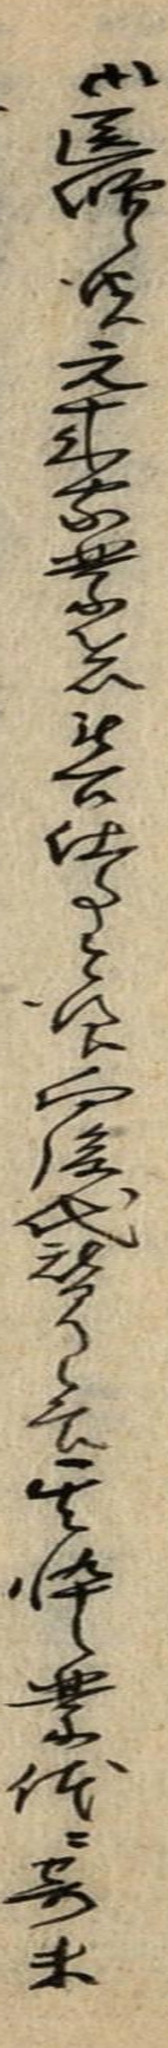御医師之儀は元来家業を以被召仕事に候得は向後代替り之節其忰之業体に寄未
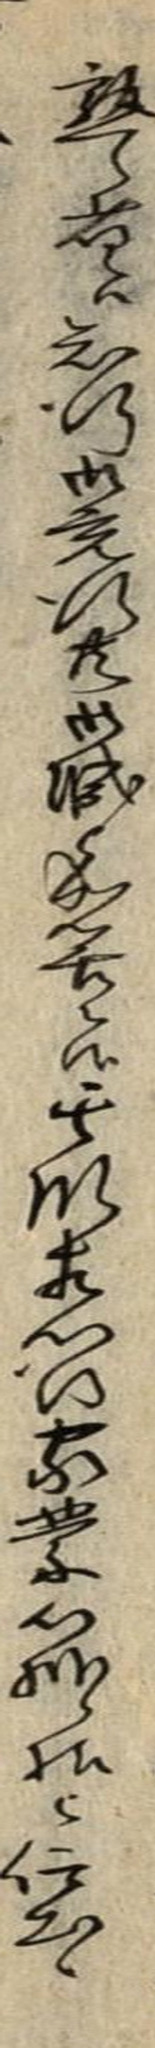熟候者へは知行御充行共御減被成筈に候其段相心得家業心掛候様被仰出候
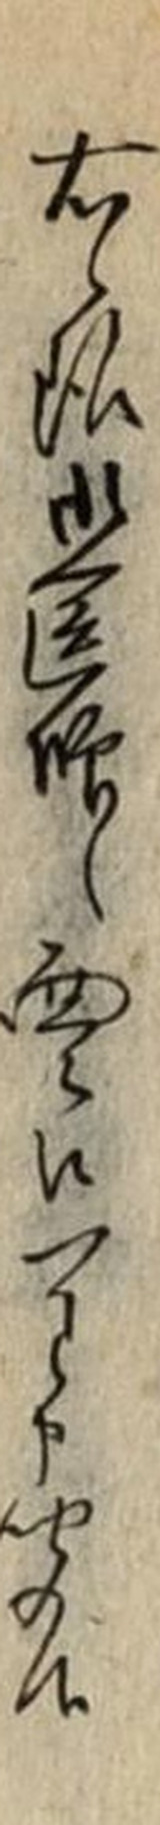右之趣御医師之面々江可被申聞候
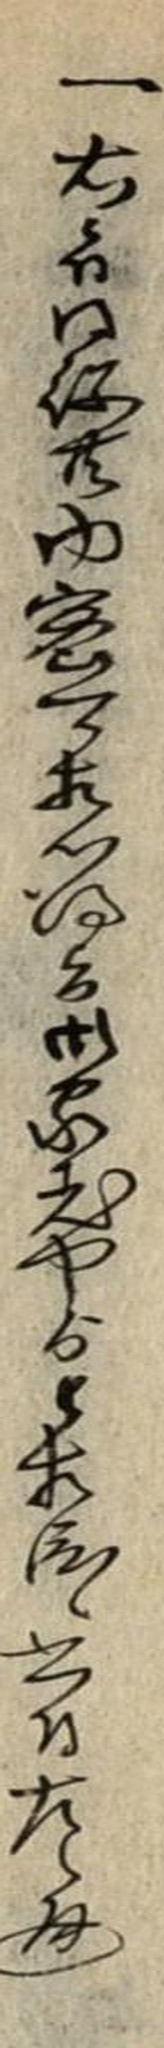一右に付同役共内密可相心得旨御家老中ゟ被相渡候書付左之通
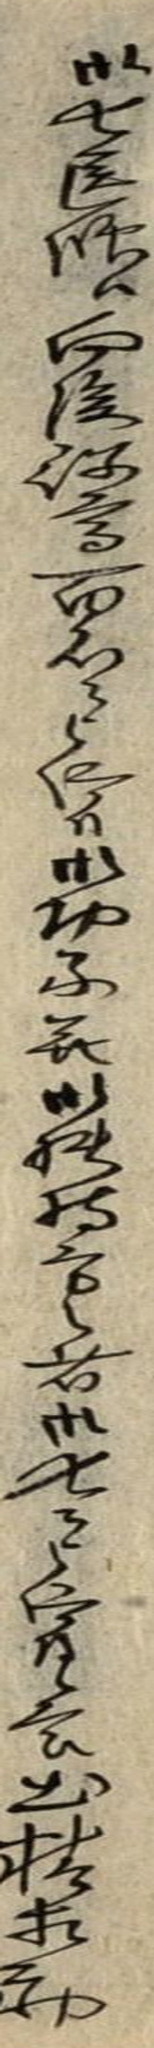御匙医師は向後役高百石に被仰付御切米并御扶持方之者御匙に被仰付候節出精相勤
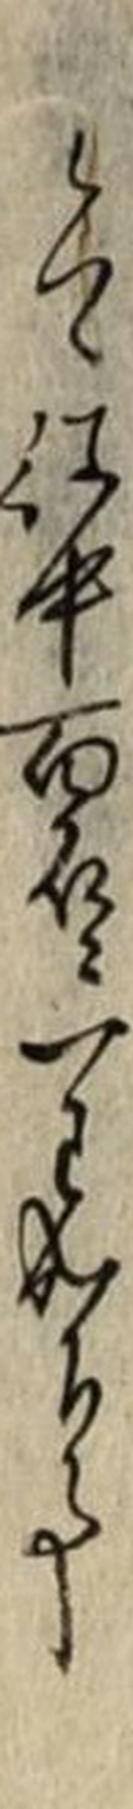候はゝ役中百石に可被成下事
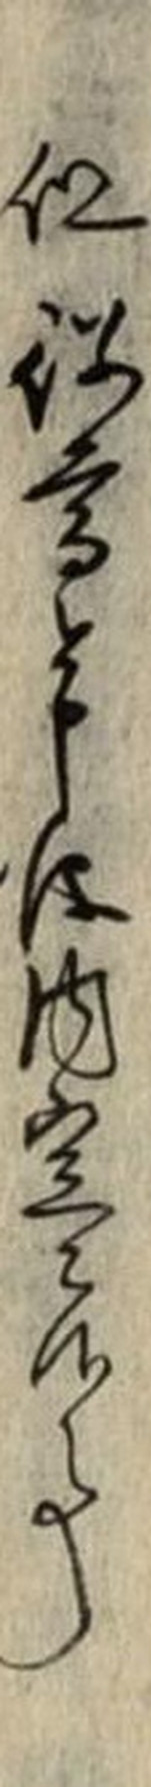但役高と申儀内定に候事
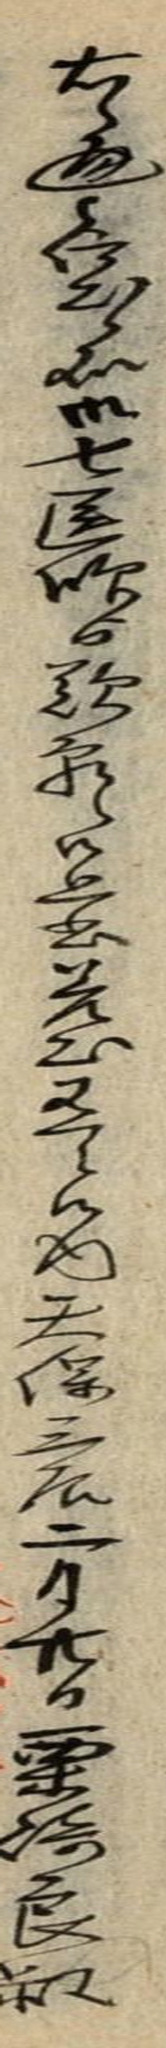右之通被仰出候処御匙医師ゟ歎願之口上書差出有之候内天保三辰二月廿日栗崎良叔
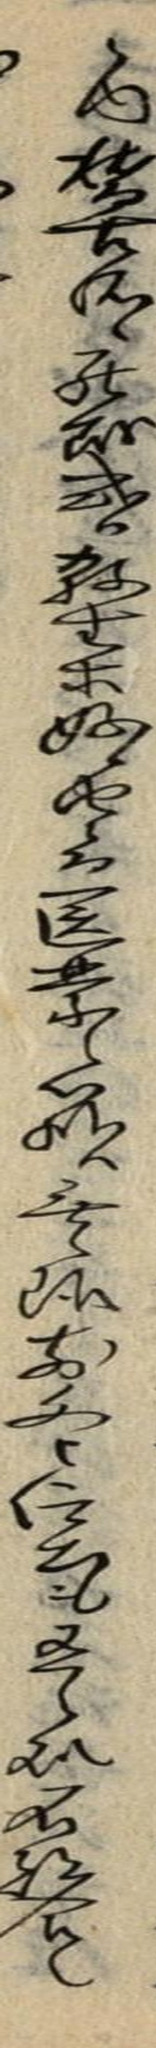候内稽古所へ罷越或は殺生等好候而医業之心掛は無之趣前文被仰出も有之処不都合之
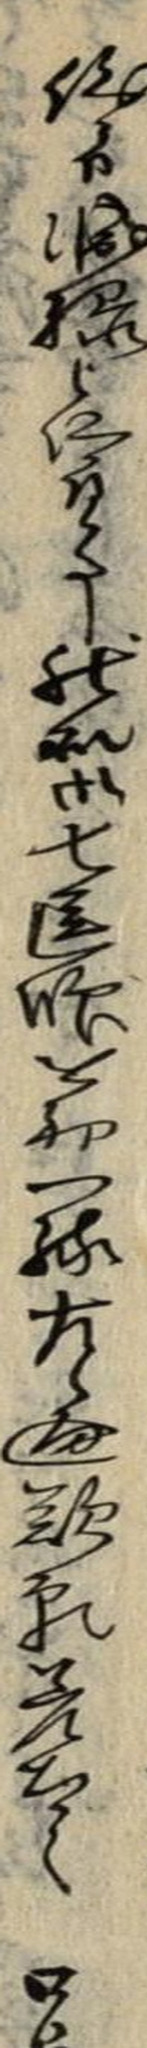儀に付減禄被仰付候事然処御匙医師を初一統左之通歎願差出之口上之控
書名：御用并被仰出之部
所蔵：福井県文書館 Fukui Prefectural Archives
